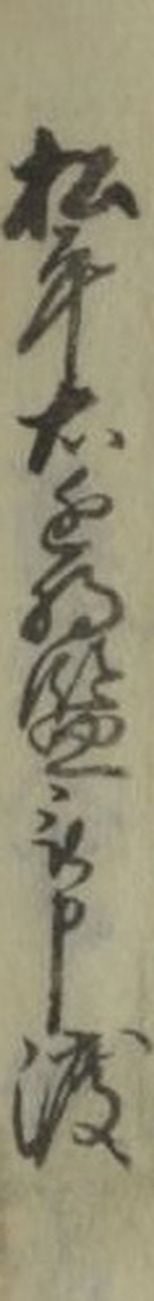松平右近将監被申渡

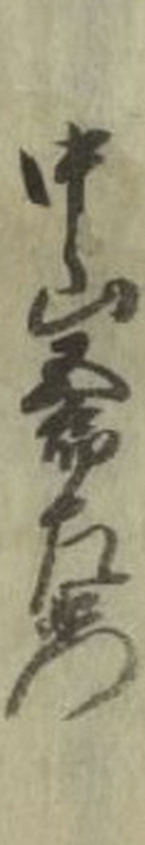中山五郎左衛門
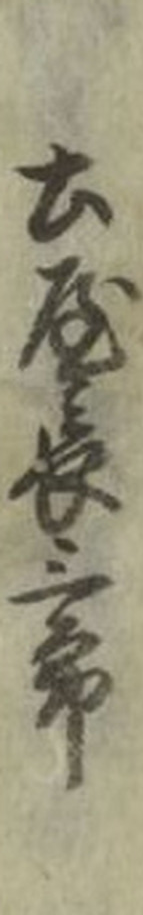土屋長三郎
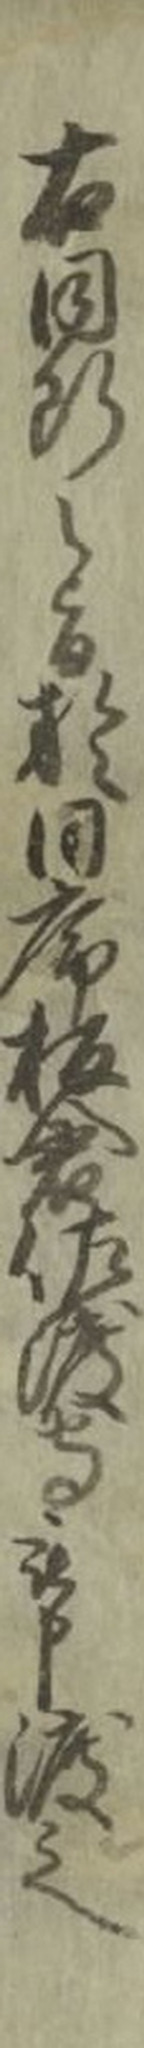右同断の旨於同席板倉佐渡守被申渡也
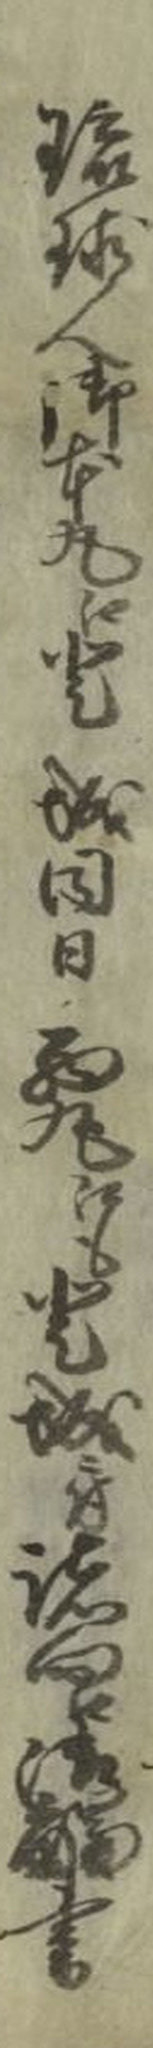琉球人御本丸え登城同日西丸えも登城に付諸向え御触書
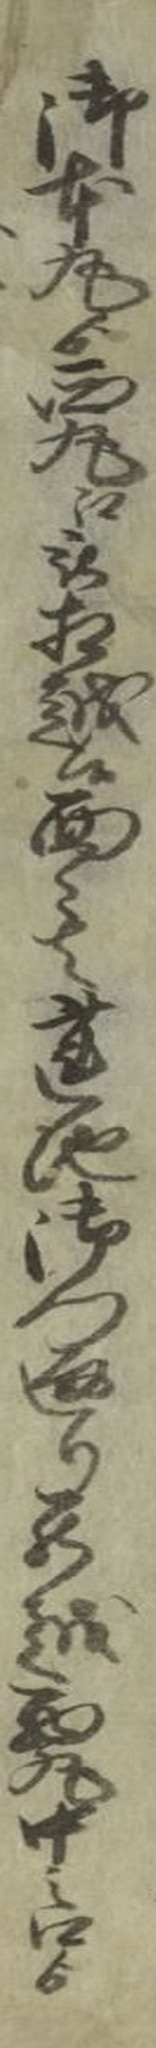御本丸ゟ西丸え被相越候面々は蓮池御門通り罷越西丸中之口ゟ
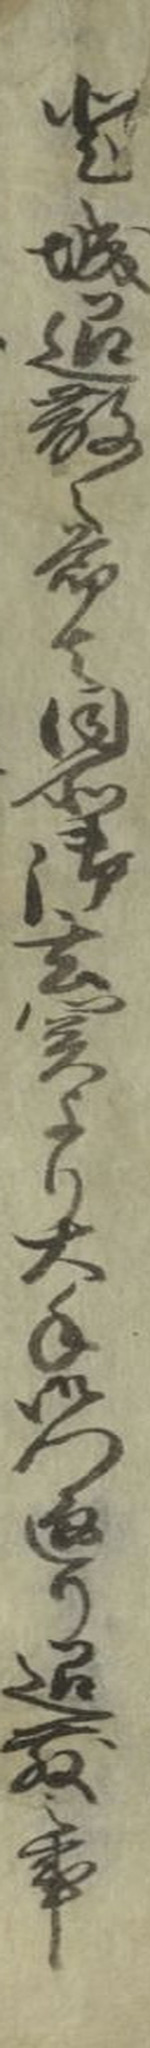登城退散之節は同所御玄関より大手御門通り退散之事
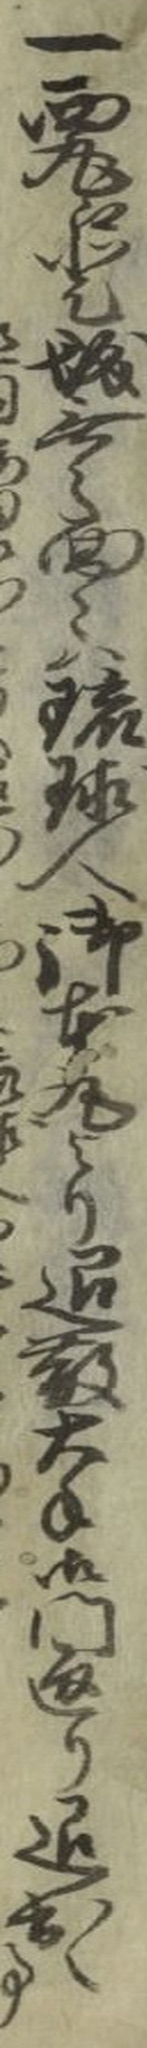一西丸え登城無之面々は琉球人御本丸より退散大手御門通り退出之事
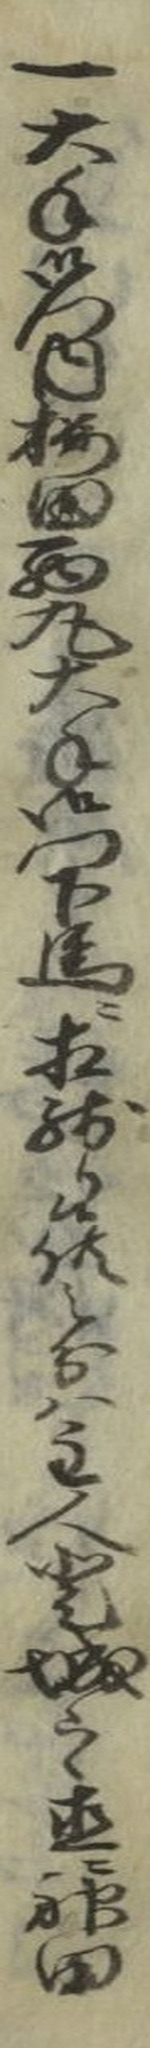一大手御門内桜田西丸大手御門下馬に相残り候供之分は主人登城直に神田
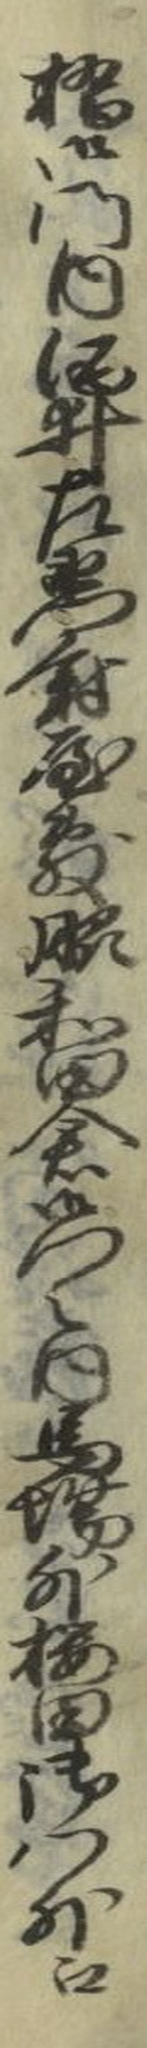櫓御門内酒井左衛門尉屋敷脇和田倉御門之内馬場外桜田御門外え
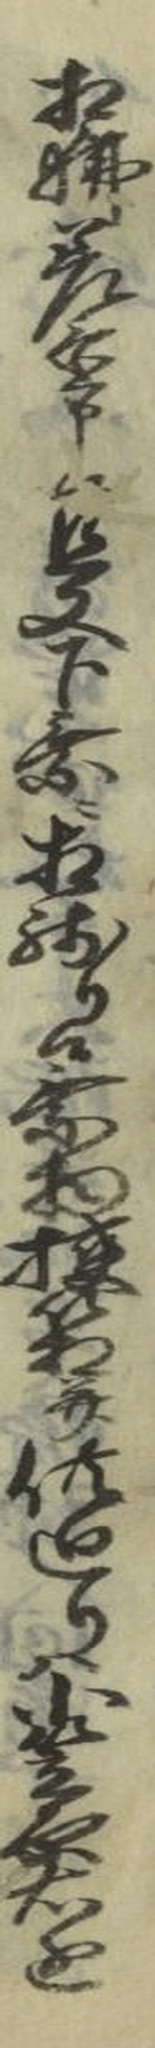相払差置申候是又下乗に相残り候乗物挟箱幷供廻りは小笠原右近
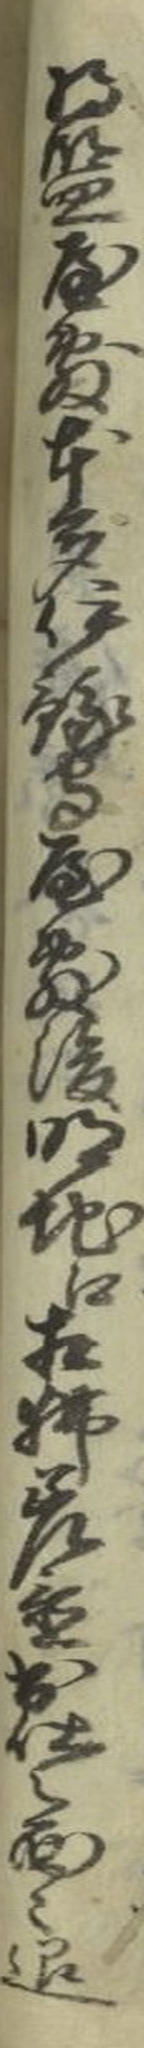将監屋敷本多伊予守屋敷後明地え相払差置出仕之面々退
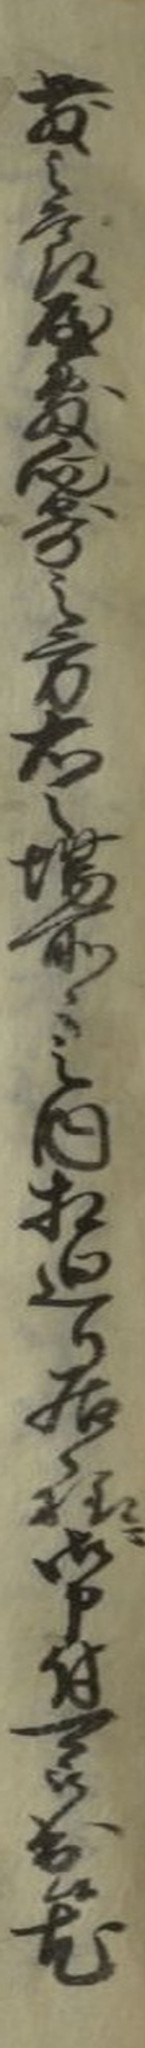散之節屋敷向寄之方右之場所之内相廻り居候様に御申付可被出候尤
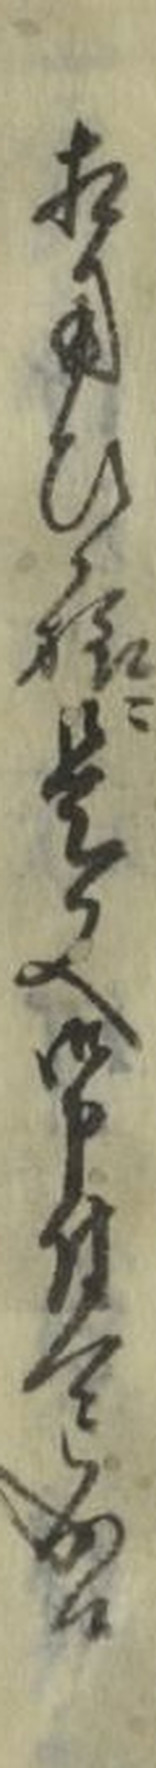相用ひ候様に是又御申付令被成候
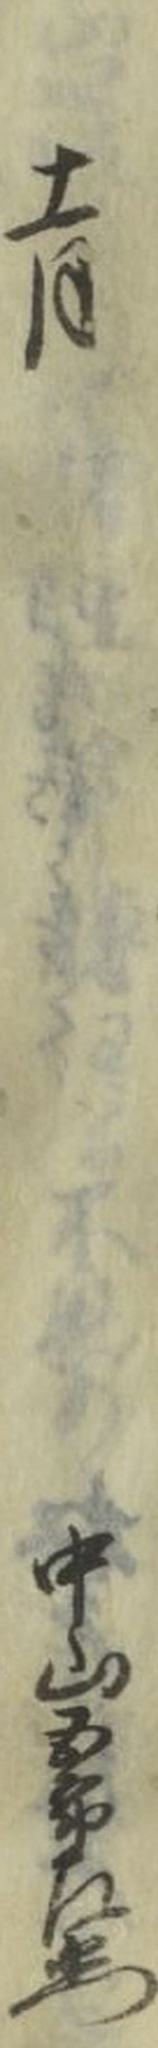十一月中山五郎左衛門
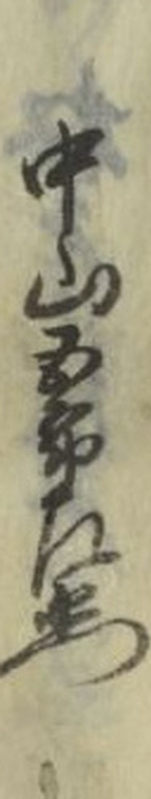中山五郎左衛門
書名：琉球人来朝之記
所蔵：University of the Ryukyus Library
